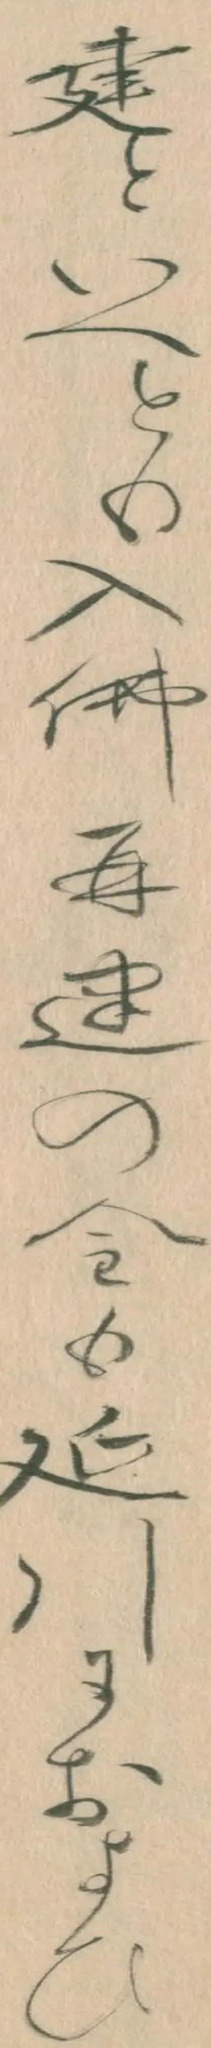建といへとも入仏再達の金も延引におよひ
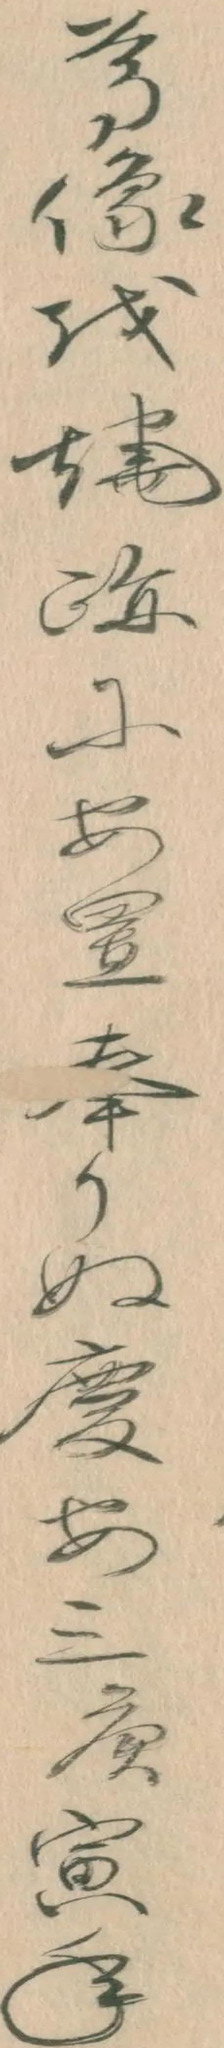尊像を焼跡に安置奉りぬ慶安三庚寅年
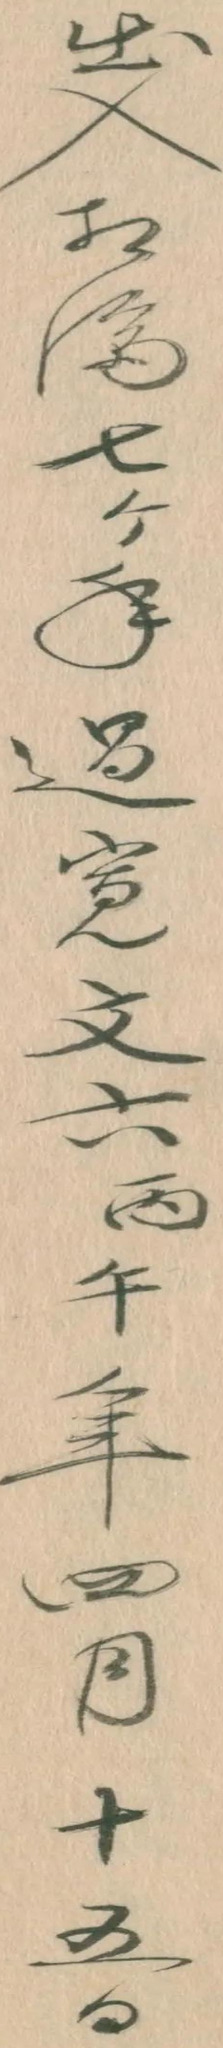出入相七ヶ年過寛文六丙午年四月十五日
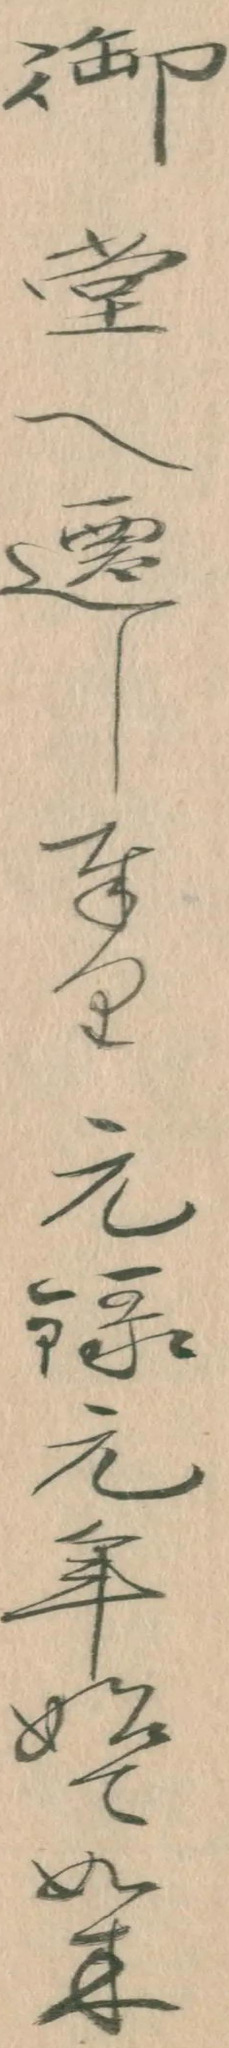御堂へ遷し奉り元禄元年始て如来
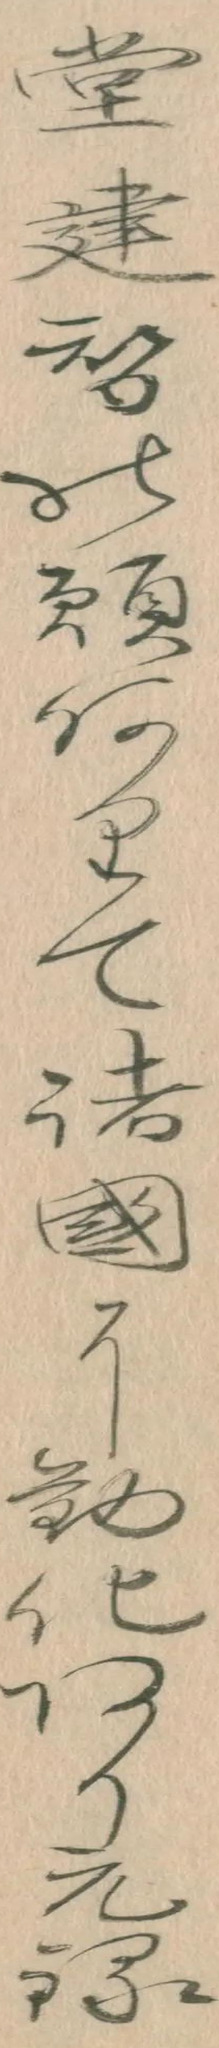堂建替の願ありて諸国に勧化あり元禄
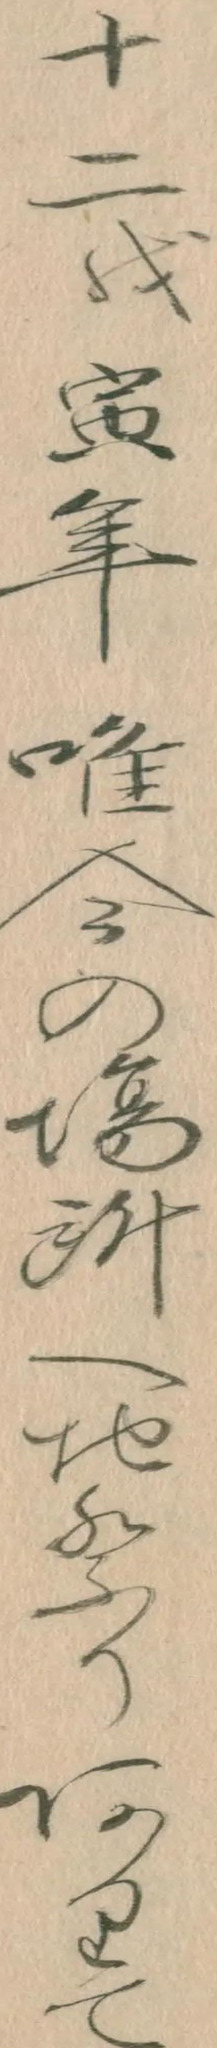十二戊寅年唯今の場所へ地祭りありて
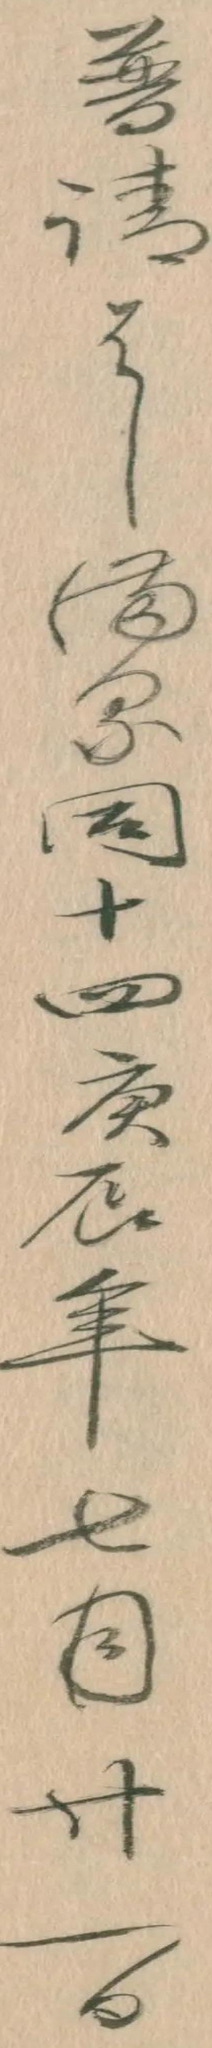普請はしまる同十四庚辰年七月廿一日
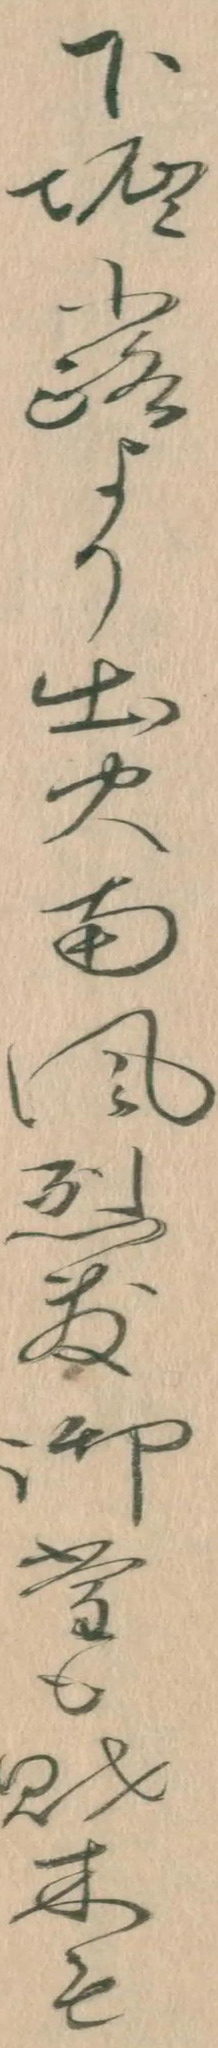下堀小路より出火南風烈敷御堂も財木も
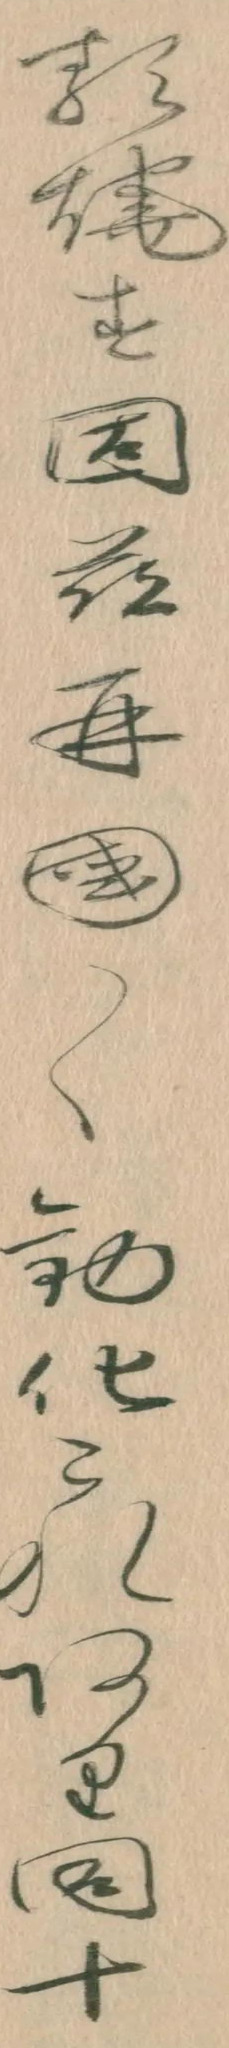類焼す固落再国〳〵勸化これあり同十
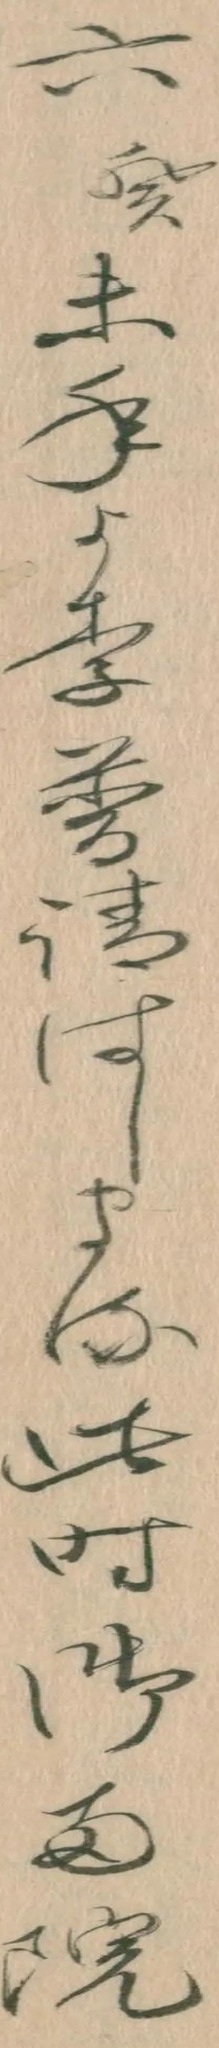六癸未年より普請はしまる此時御両院
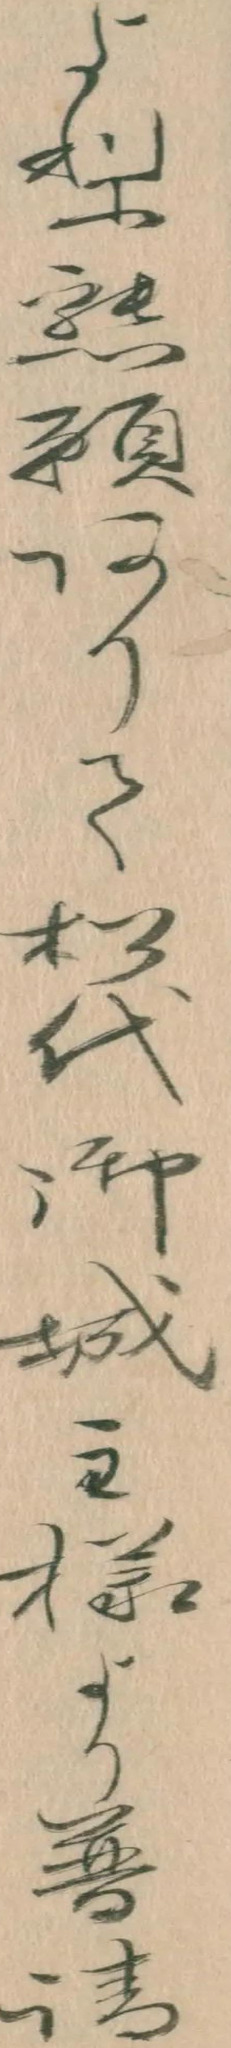より熟願ありて松代御城主様より普請
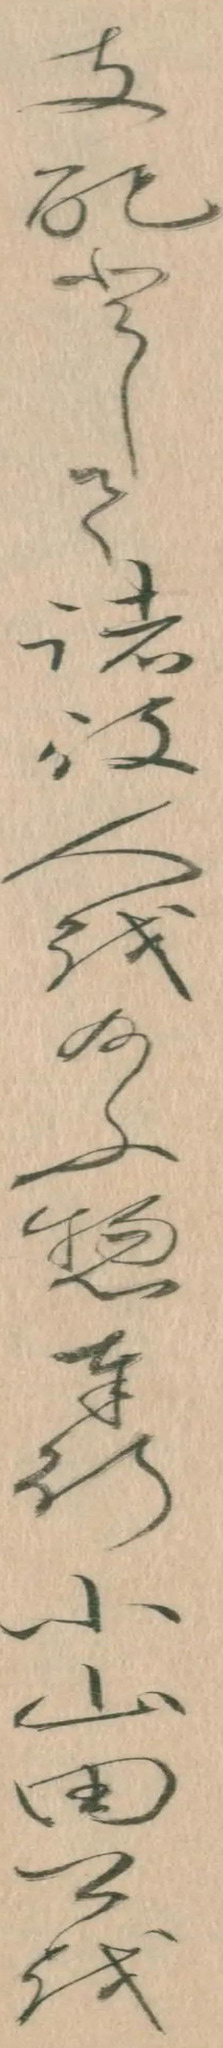支配として諸役人を給ふ惣奉行山田を
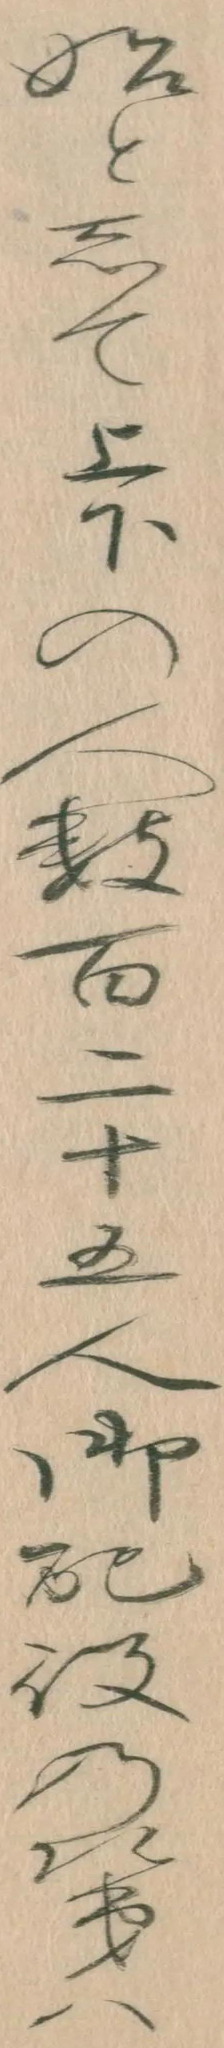始として上下の人数百二十五人御配役の次第は
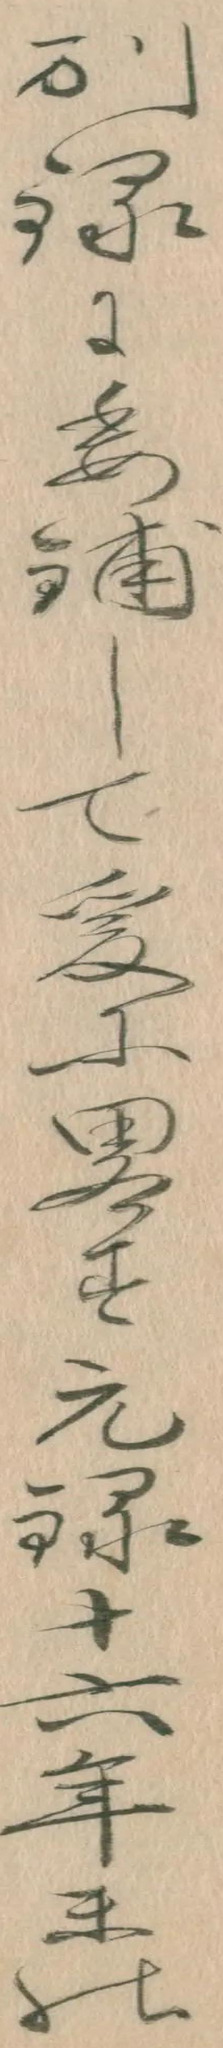別錄に委鋪して爰に略す元禄十六年末の
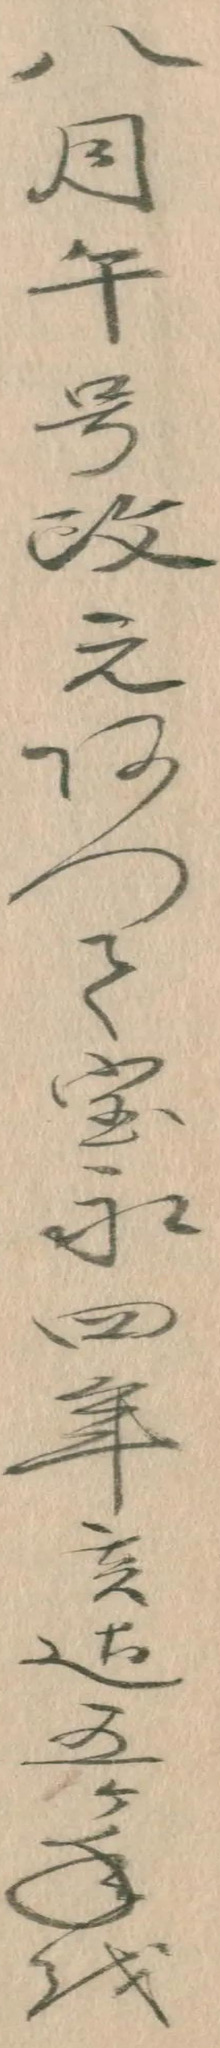八月年号改元あつて宝永四年亥迄五ヶ年を
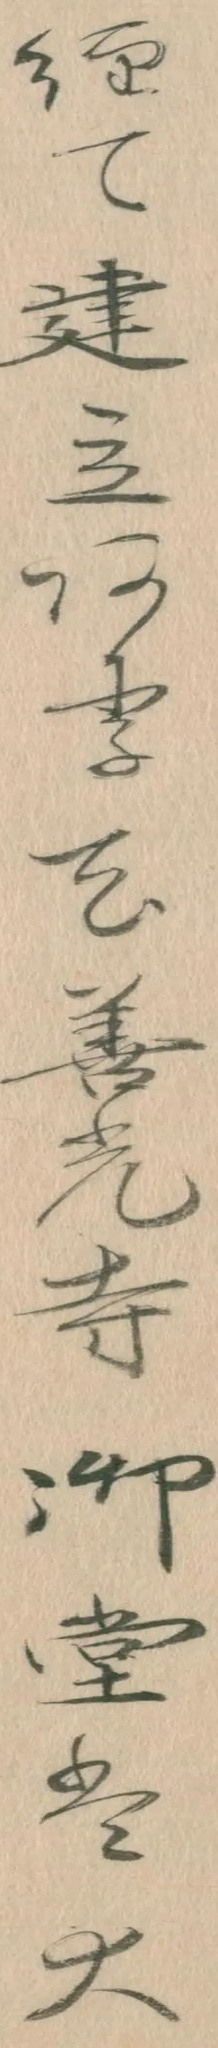経て建立あり善光寺御堂は大
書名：俗語之種. [1]
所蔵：国立国会図書館 National Diet Library, JAPAN
